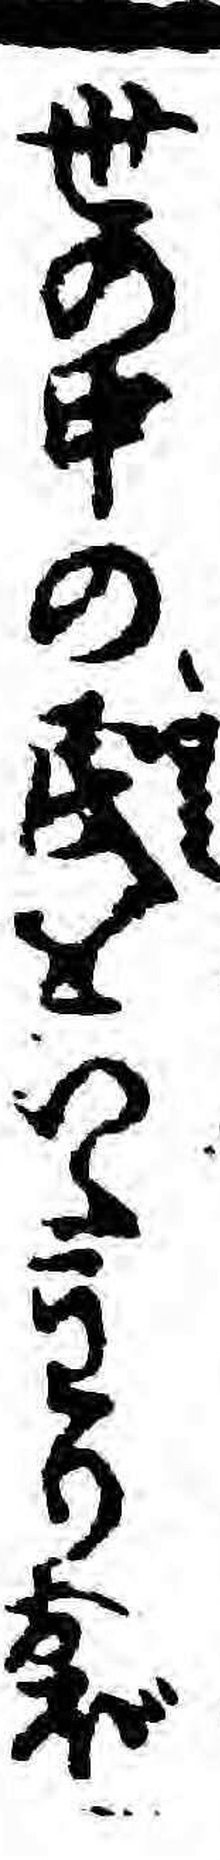世の中の民をいたわりおぼ
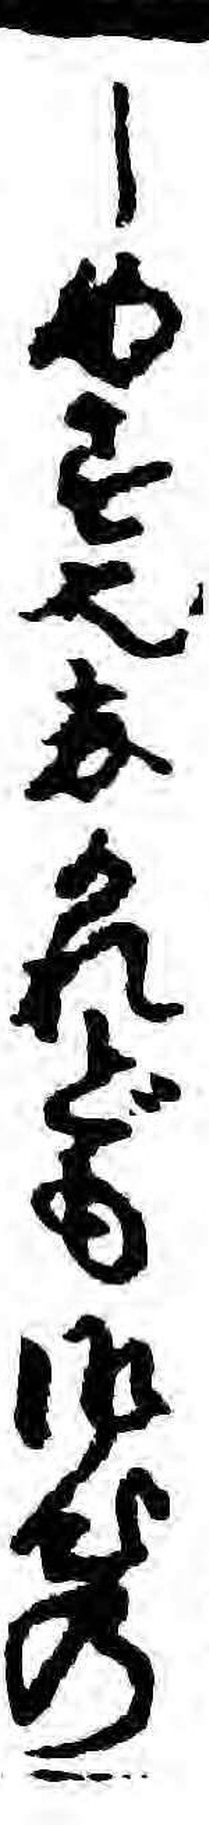しめす也しかれども御心の
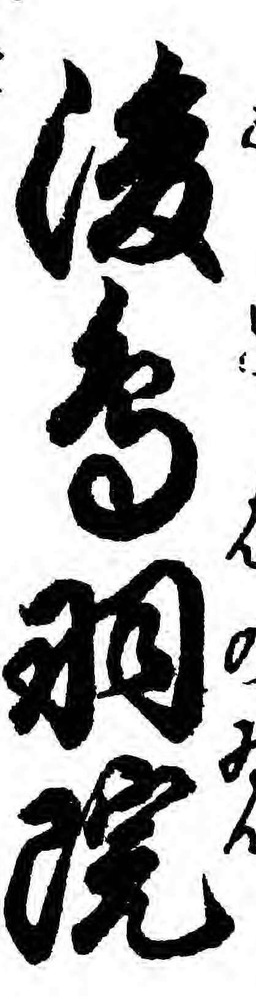後鳥羽院
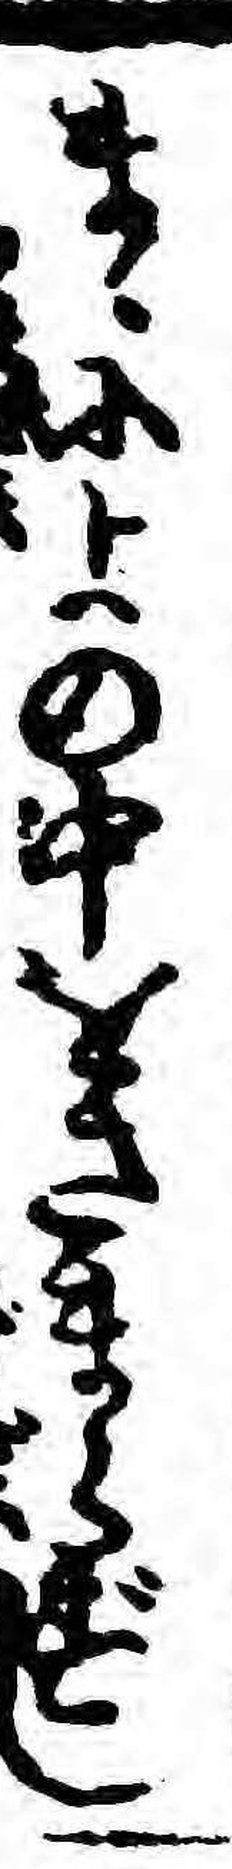まゝによの中をさまらずし
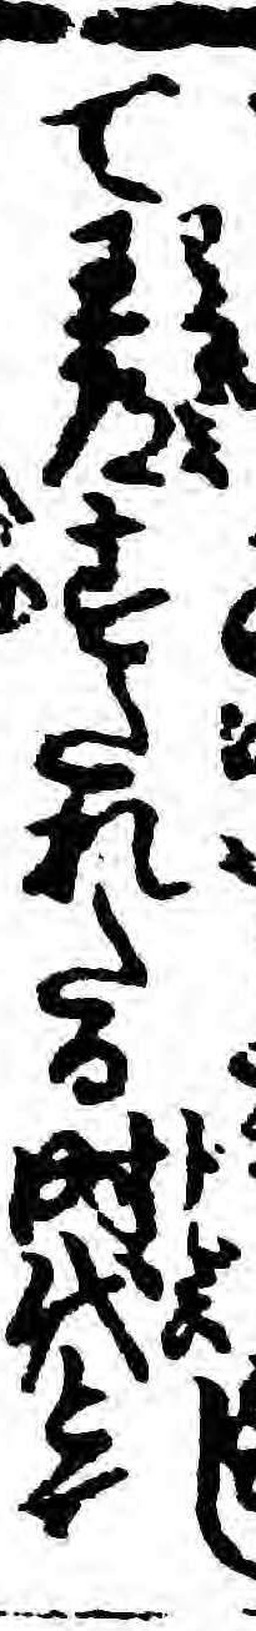て王道すたれたる時代とて
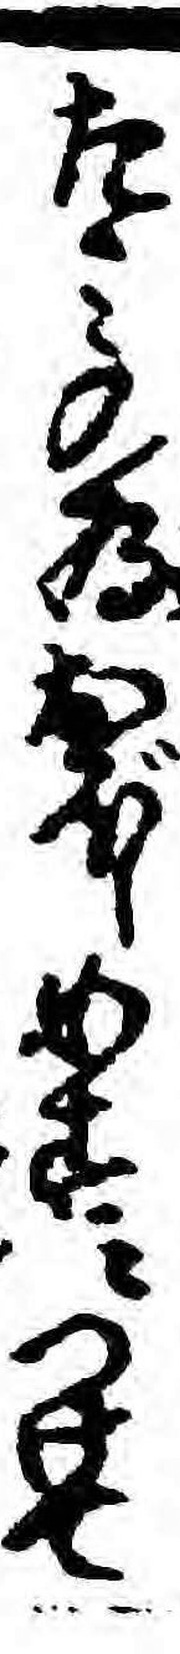たみの為おぼしめすにつけて
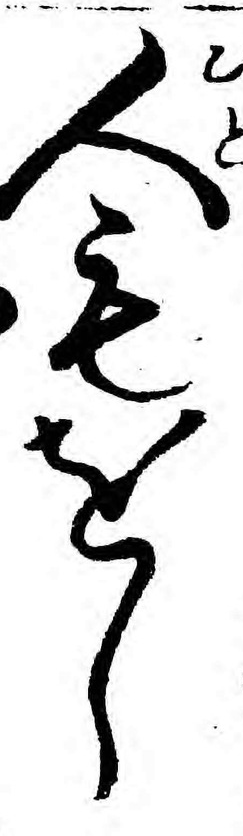人もをし
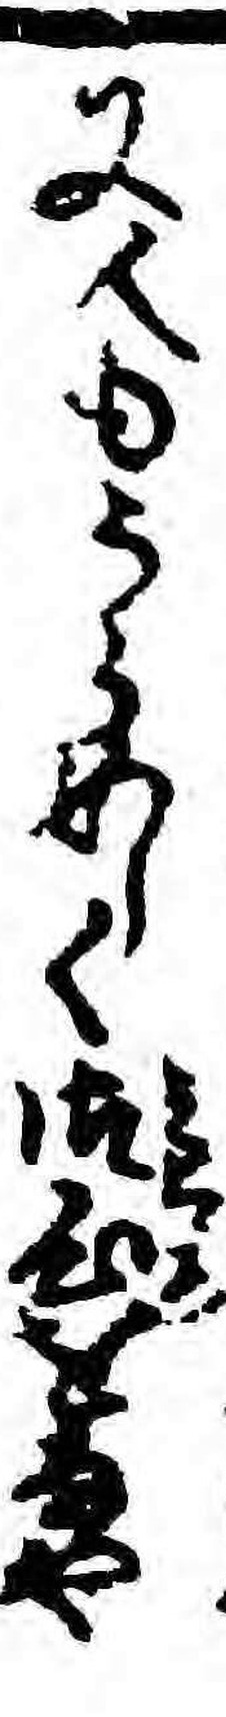又人もうらめしく御心をなや
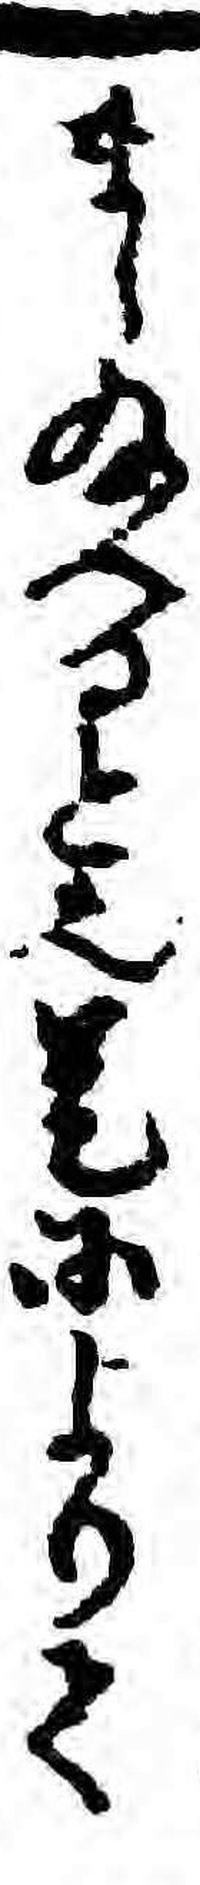まし給へると也是によりて
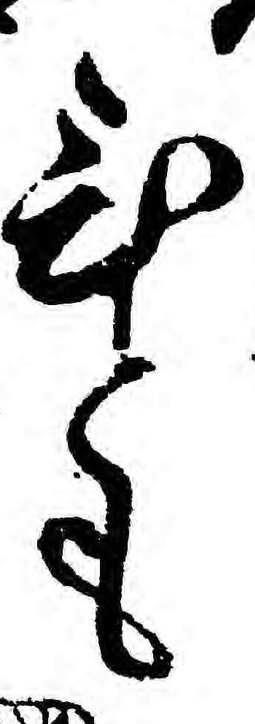ひとも
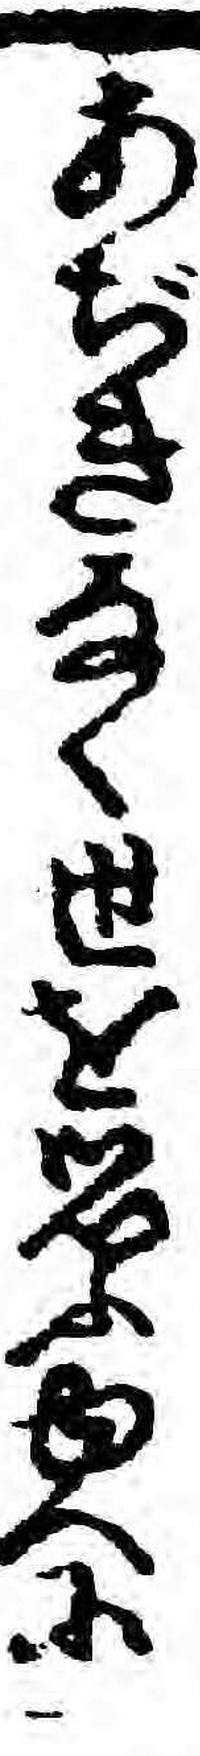あぢきなく世を思ふゆへに
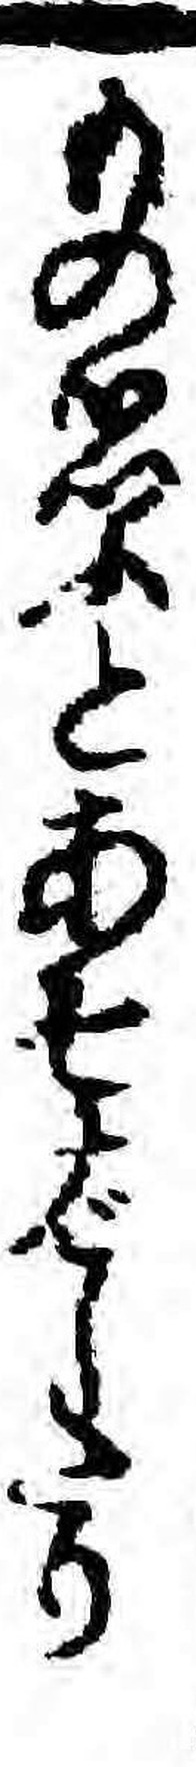もの思ふとあそばしたり
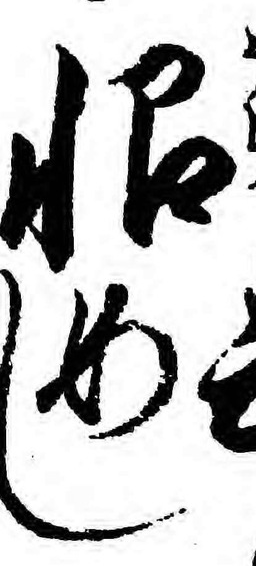恨めし
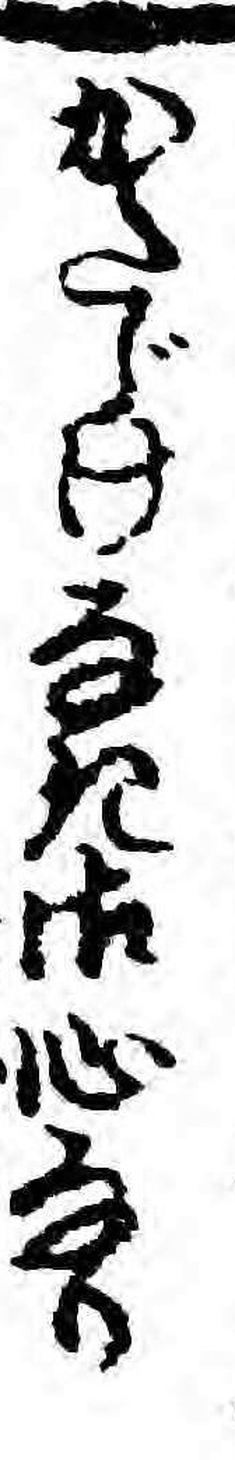かたじけなき御心なり
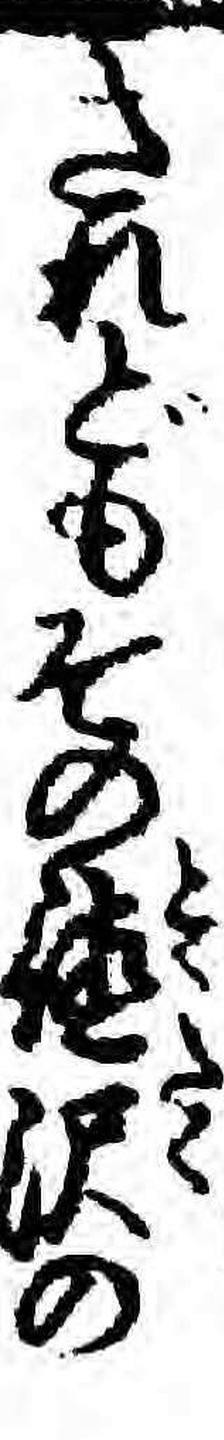されどもその徳沢の
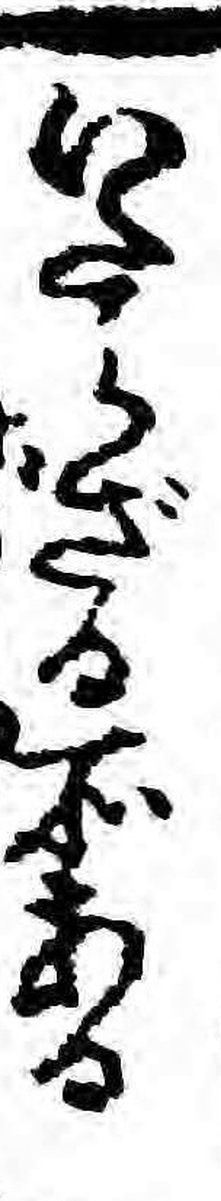いたらざる所ある
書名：頭書和歌注譯／壽賀多百人一首小倉錦
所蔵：国文学研究資料館
